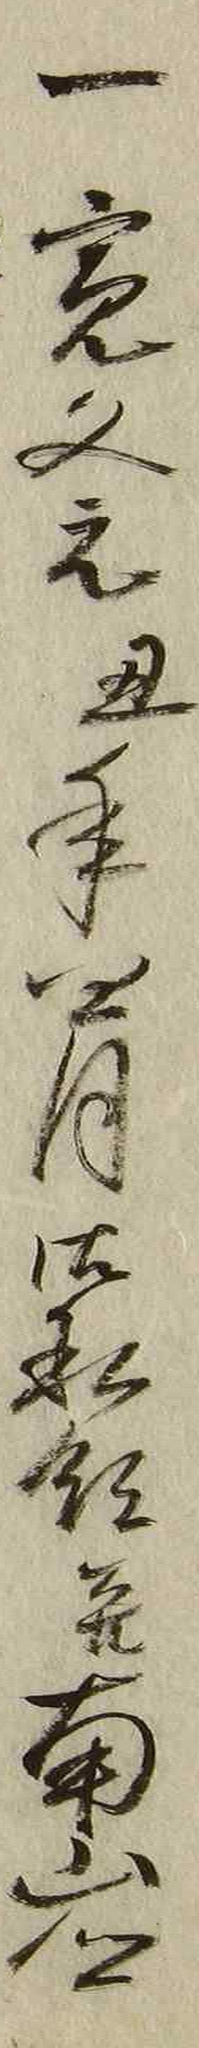一寛文元丑年四月御私領并南山郷
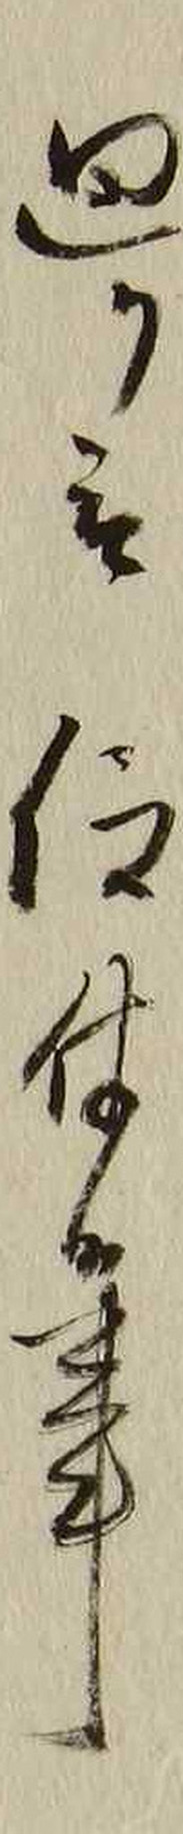廻り被仰付候事
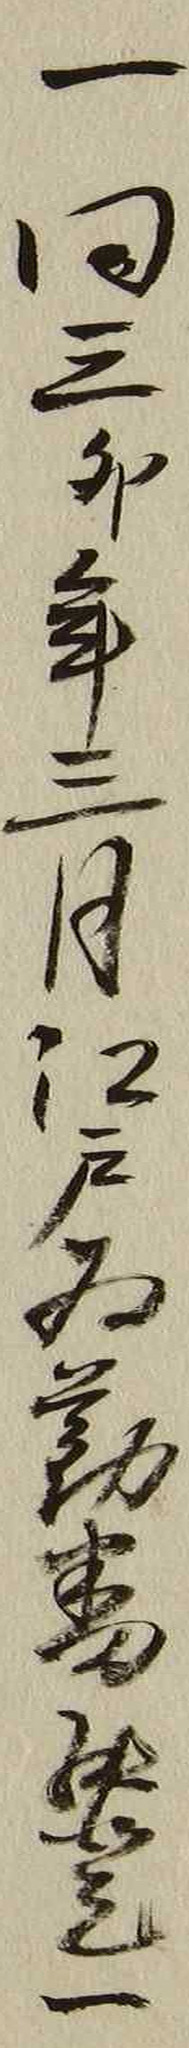一同三卯年三月江戸為勤番罷登一
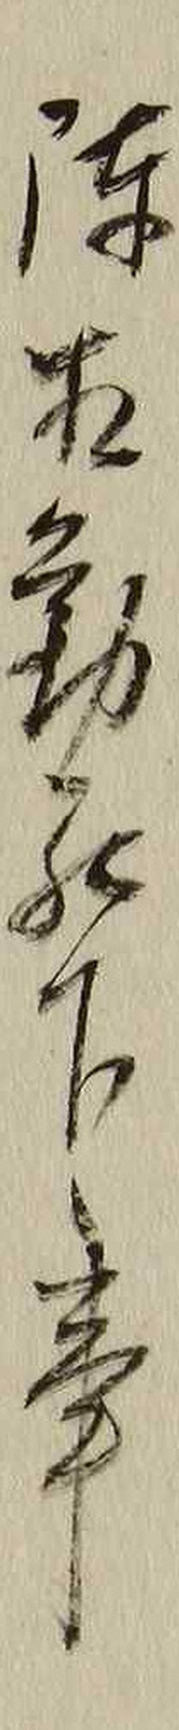陣相勤罷下候事
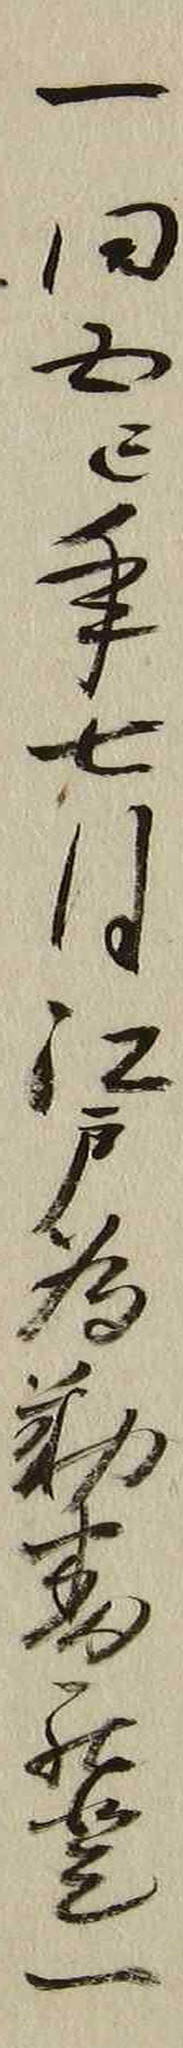一同五巳年七月江戸為勤番罷登一
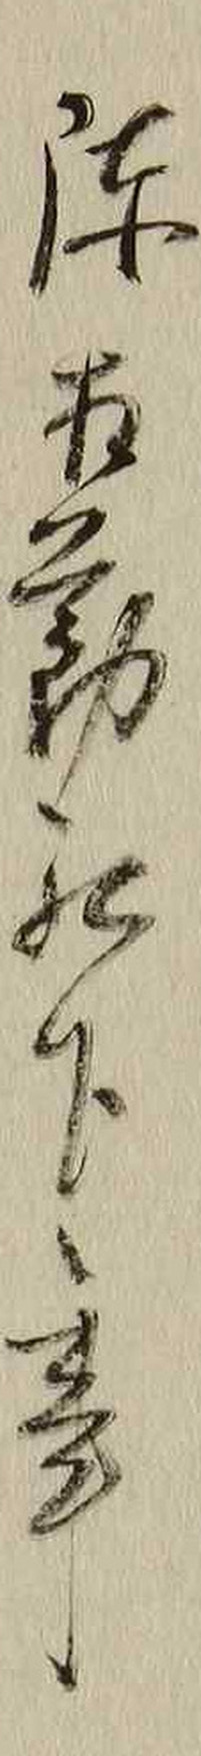陣相勤罷下候事
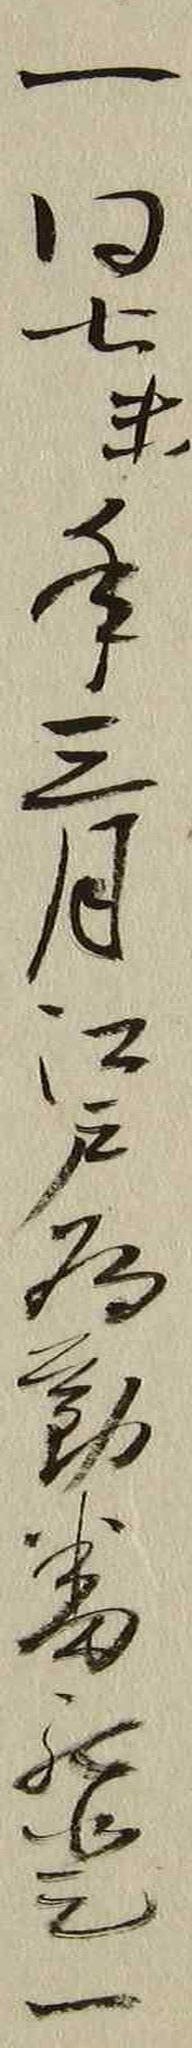一同七未年三月江戸為勤番罷登一
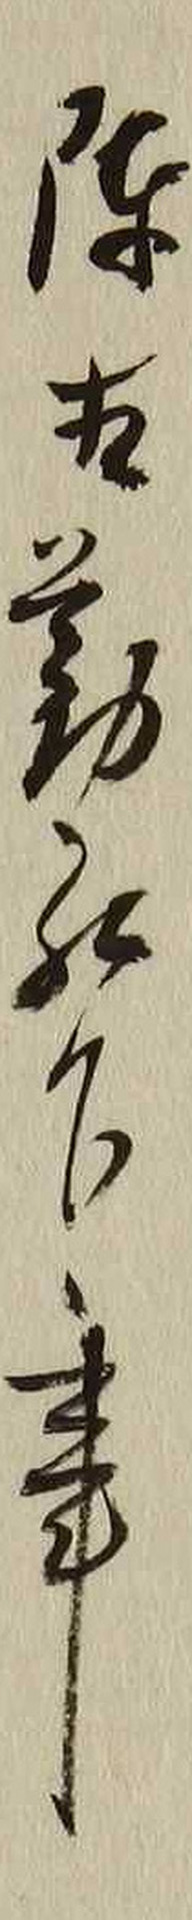陣相勤罷下候事
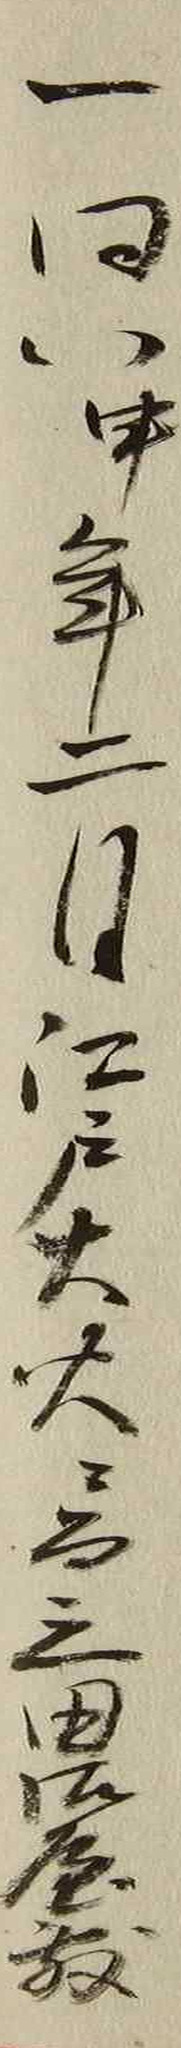一同八申年二月江戸大火ニ而三田御屋敷
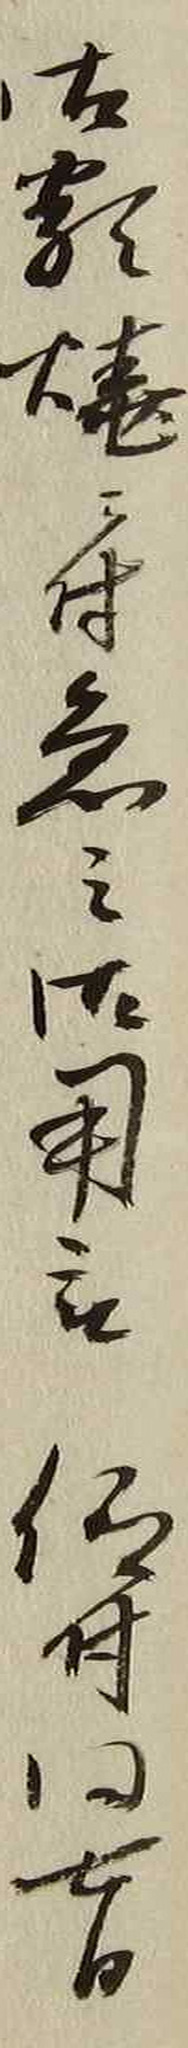御類焼ニ付急之御用被仰付同七日
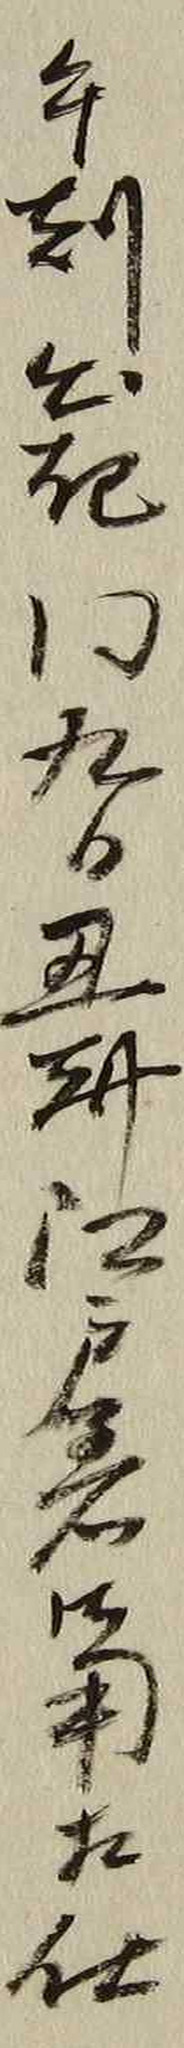午刻出起同九日丑刻江戸着御用相仕
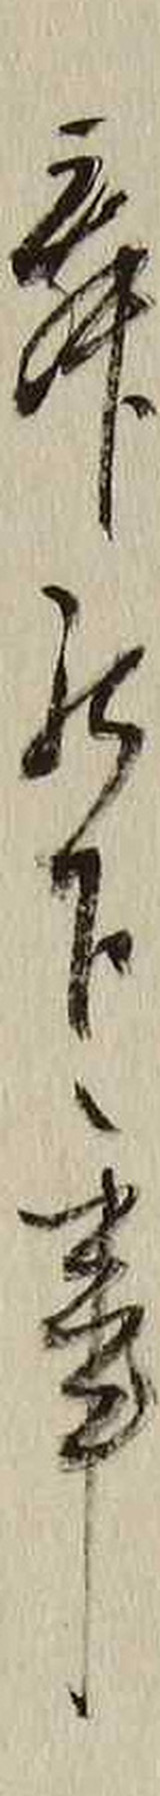舞罷下候事
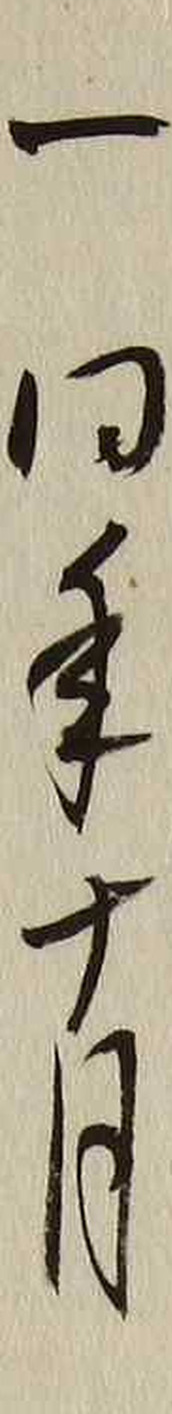一同年十月
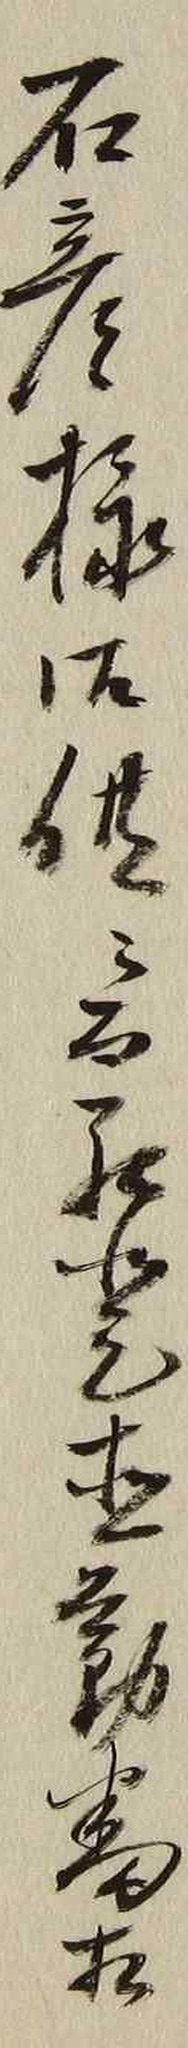石彦様御供ニ而罷登直勤番相
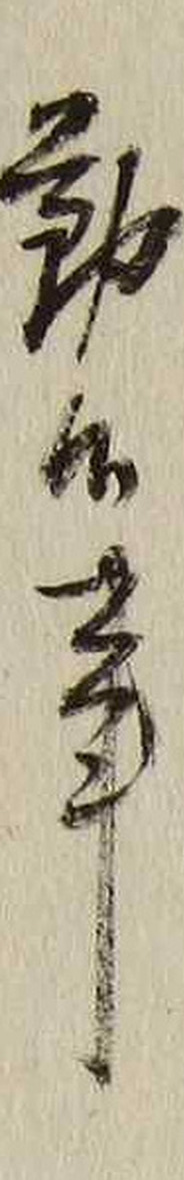勤候事
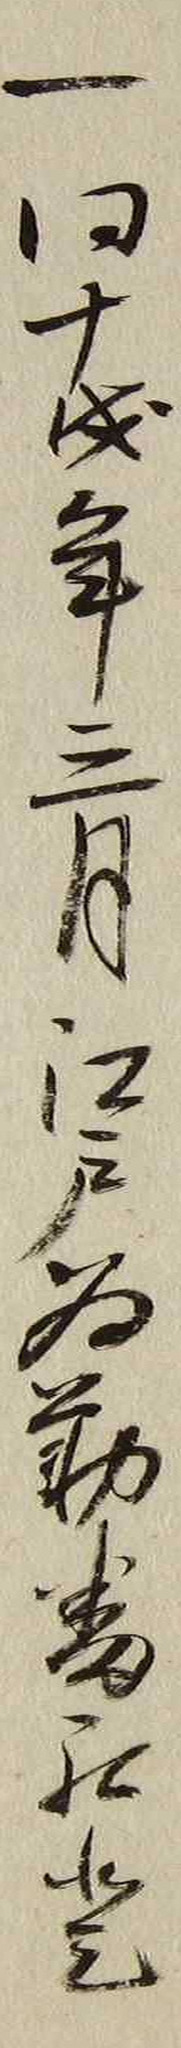一同十戌年三月江戸為勤番罷登
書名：諸士系譜　巻之352　す之部2
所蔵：会津若松市立会津図書館
